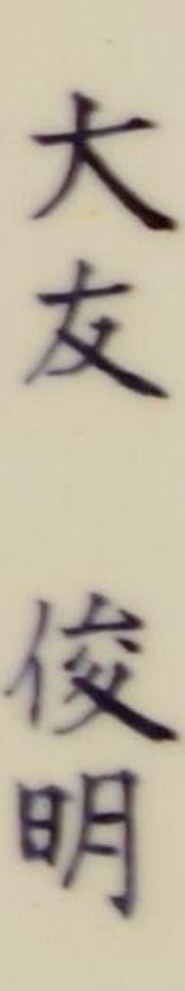大友俊明
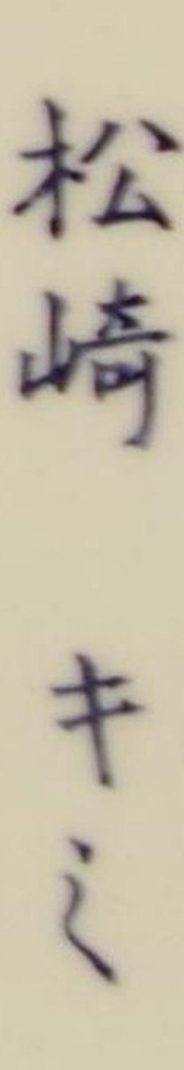松崎キミ
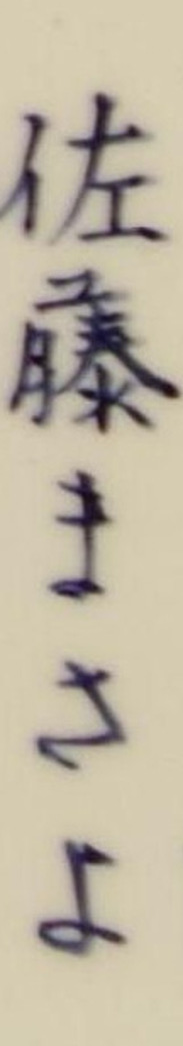佐藤まさよ
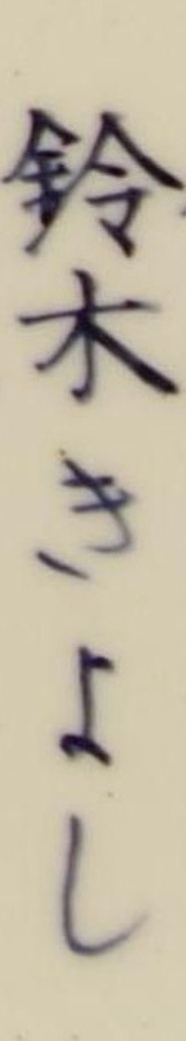鈴木きよし
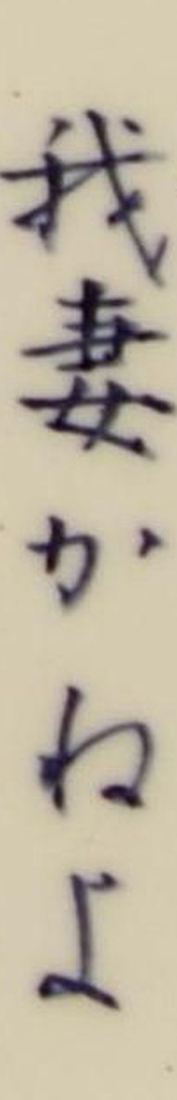我妻かねよ
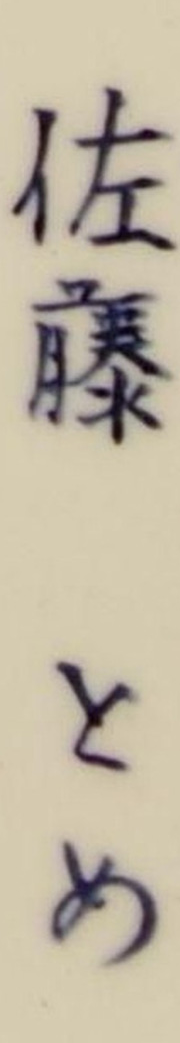佐藤とめ
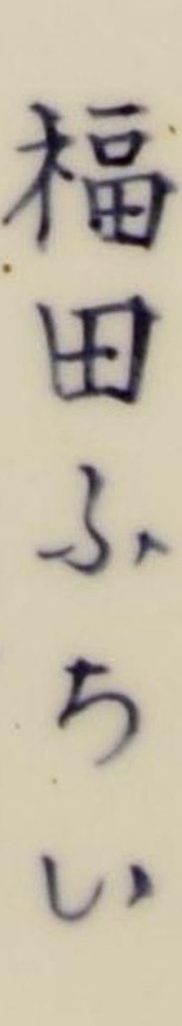福田ふちい
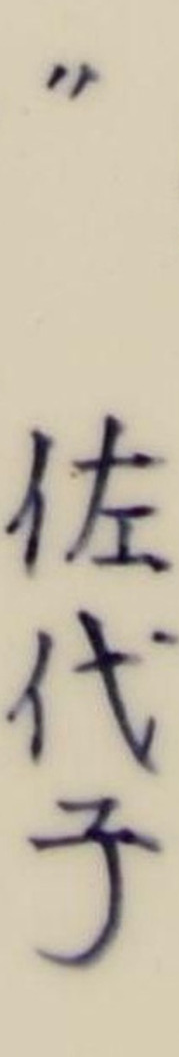佐代子
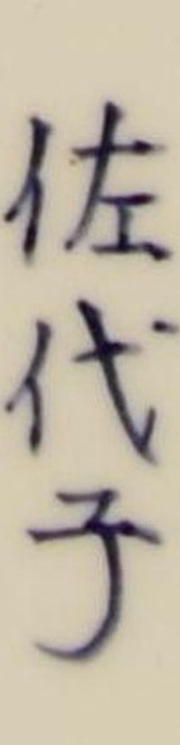佐代子
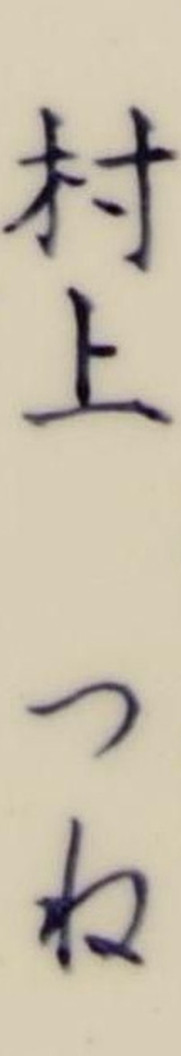村上つね
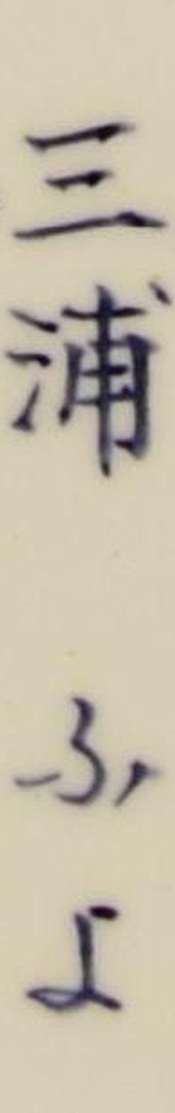三浦ふよ
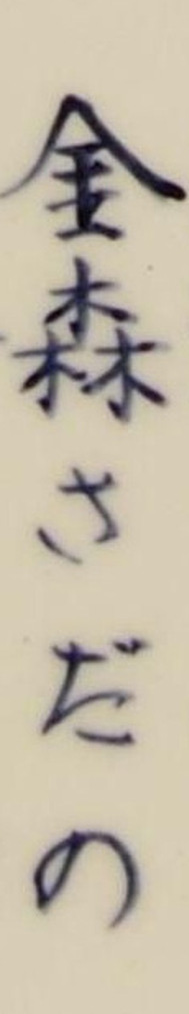金森さだの
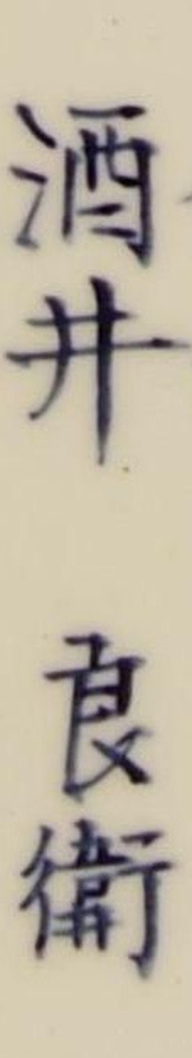酒井良衛
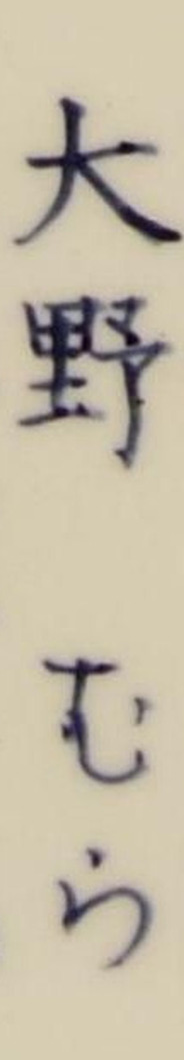大野はら
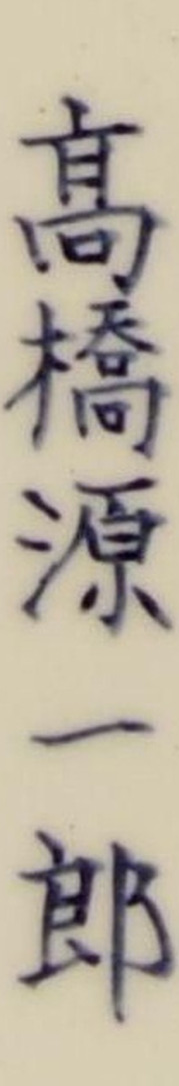高橋源一郎
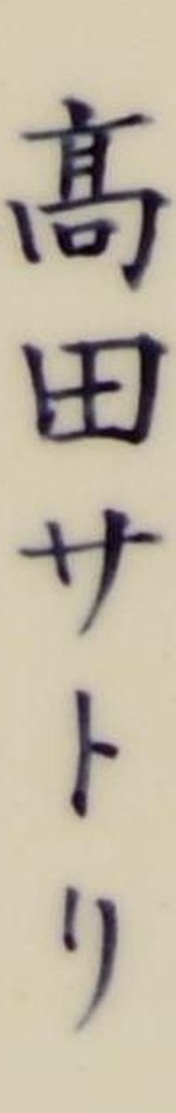高田サトリ
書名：A~D
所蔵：koyasan kongobuji
